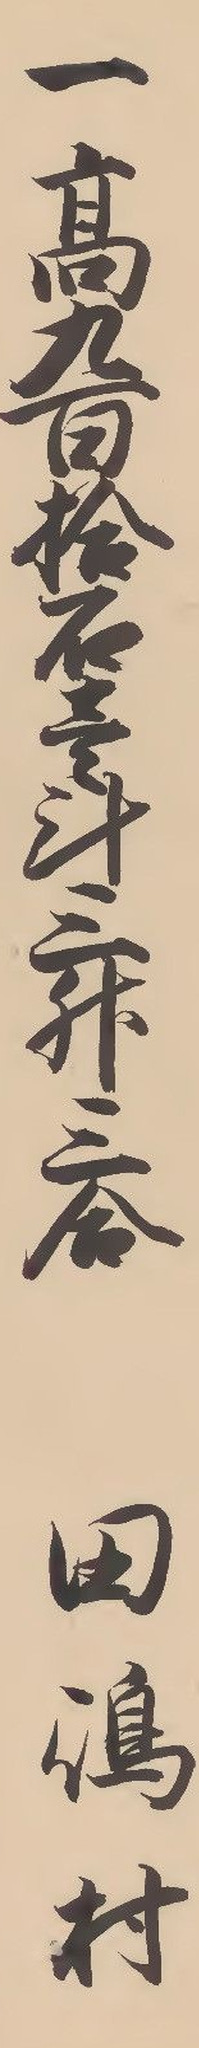一高九百拾石壱斗三升三合田嶋村
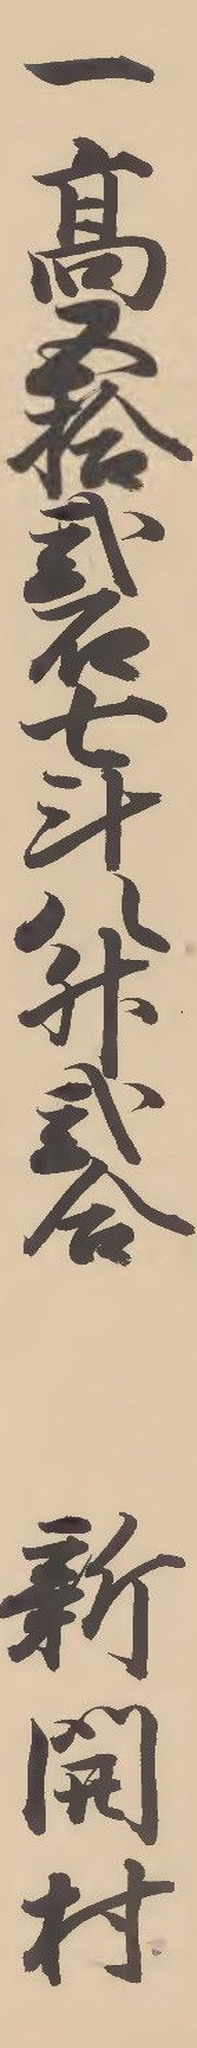一高五拾弐石七斗八升弐合新開村
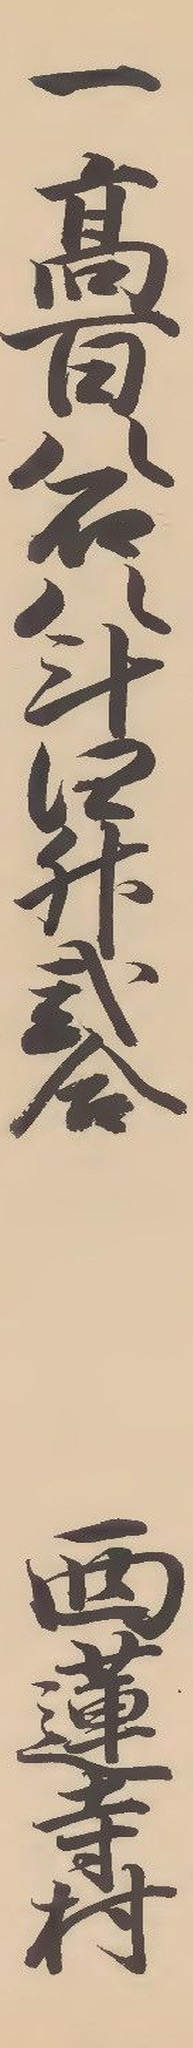一高百八石八斗四升弐合西蓮寺村
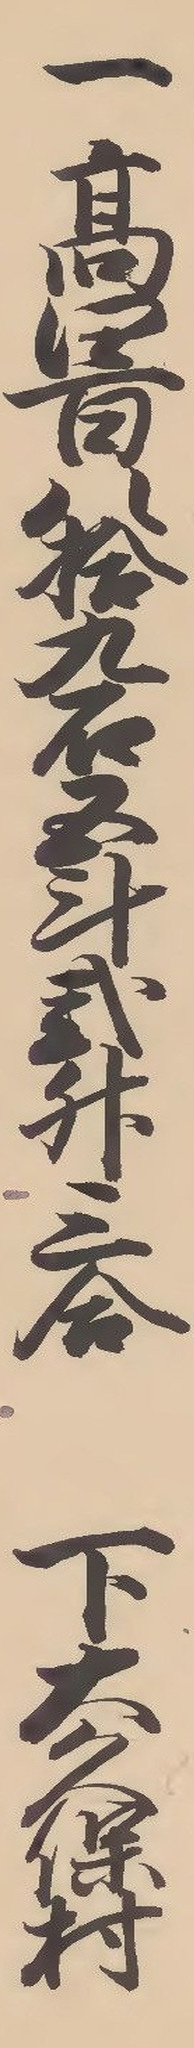一高四百九石五斗弐升三合下大久保村

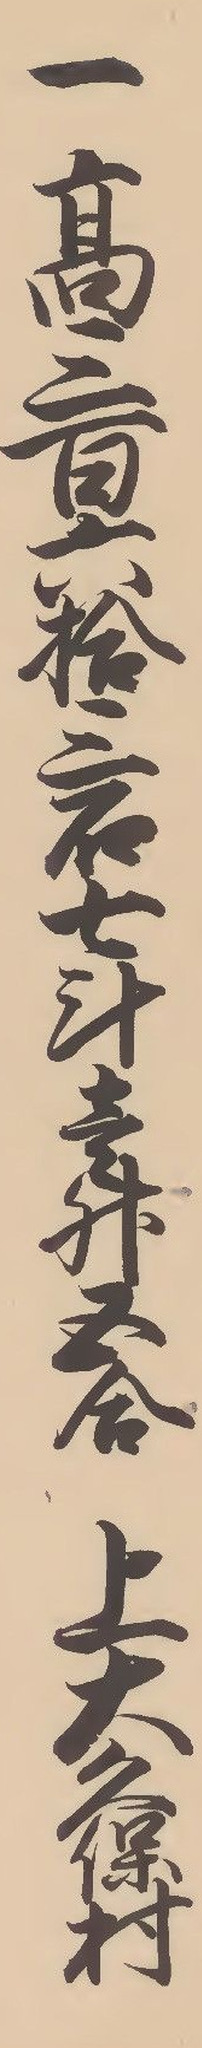一高三百六拾三石七斗壱升五合上大久保村
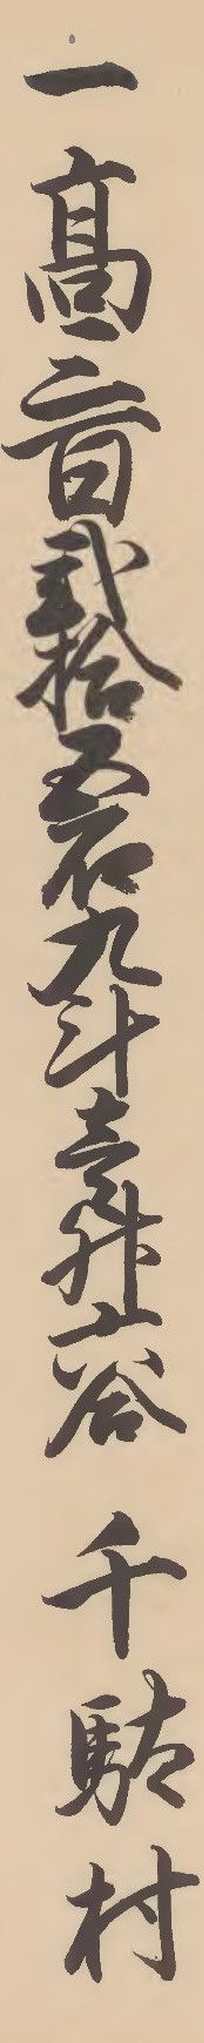一高三百弐拾五石九斗壱升六合千駄村
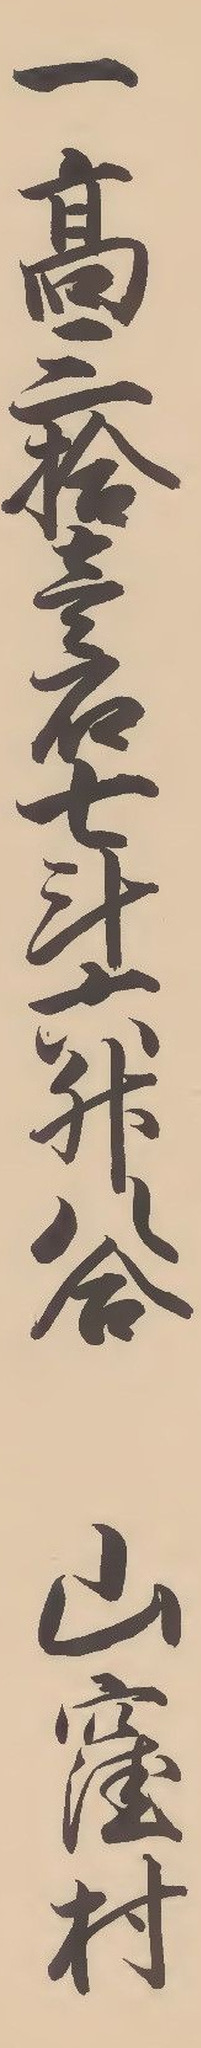一高三拾壱石七斗六升八合山窪村
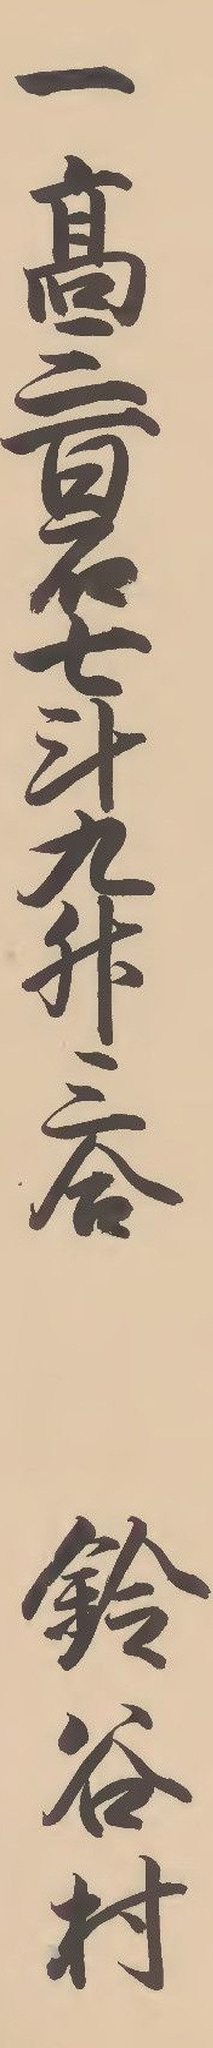一高三百石七斗九升三合鈴谷村
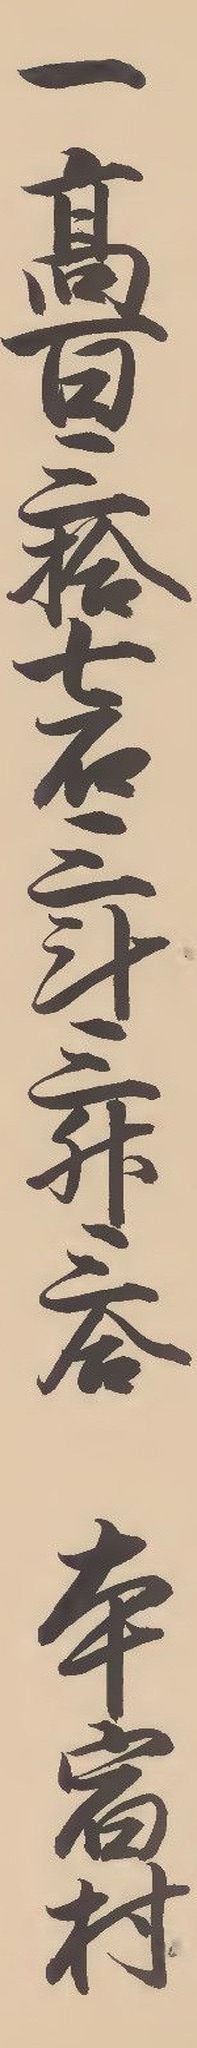一高百三拾七石三斗三升三合本宿村
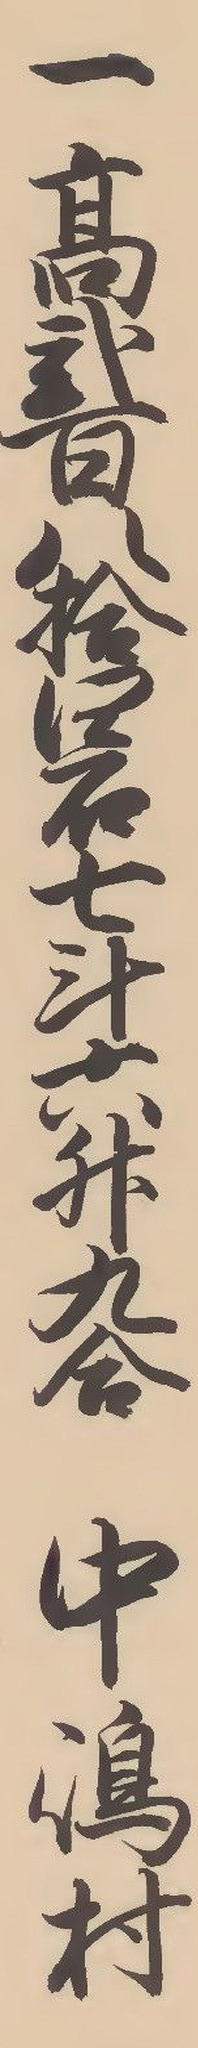一高弐百八拾四石七斗六升九合中嶋村
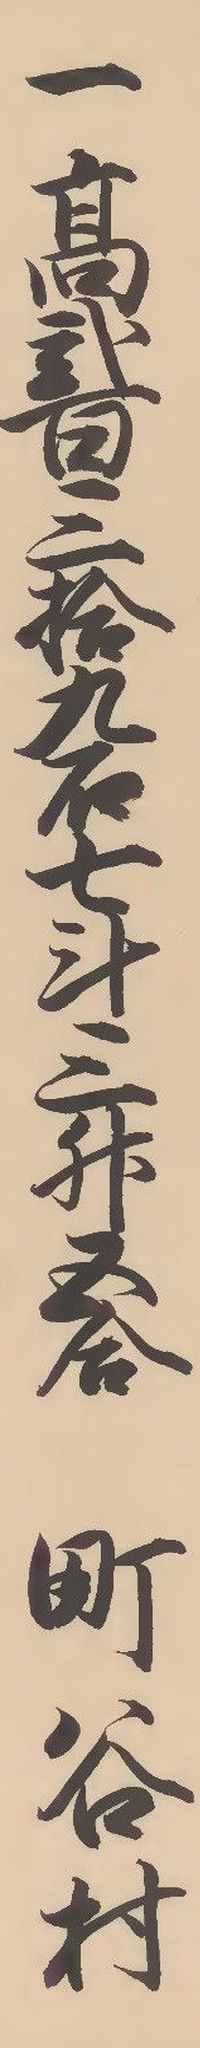一高弐百三拾九石七斗三升五合町谷村
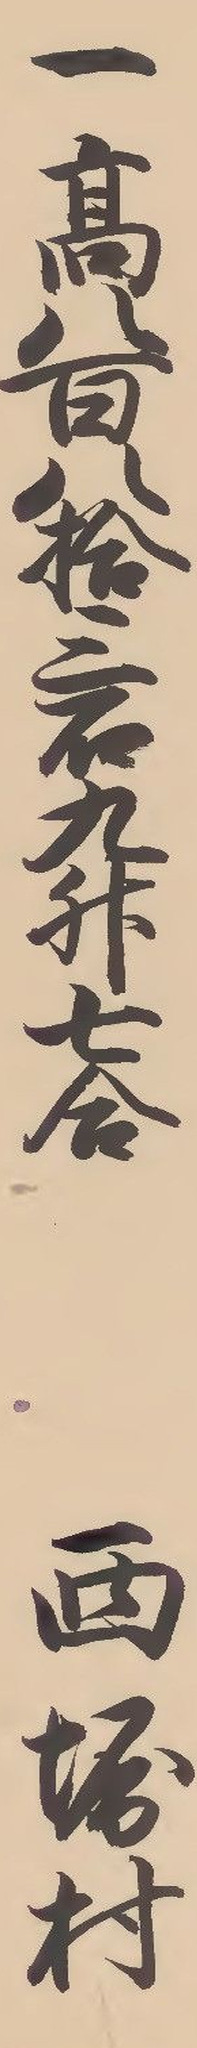一高八百八拾三石九升七合西堀村

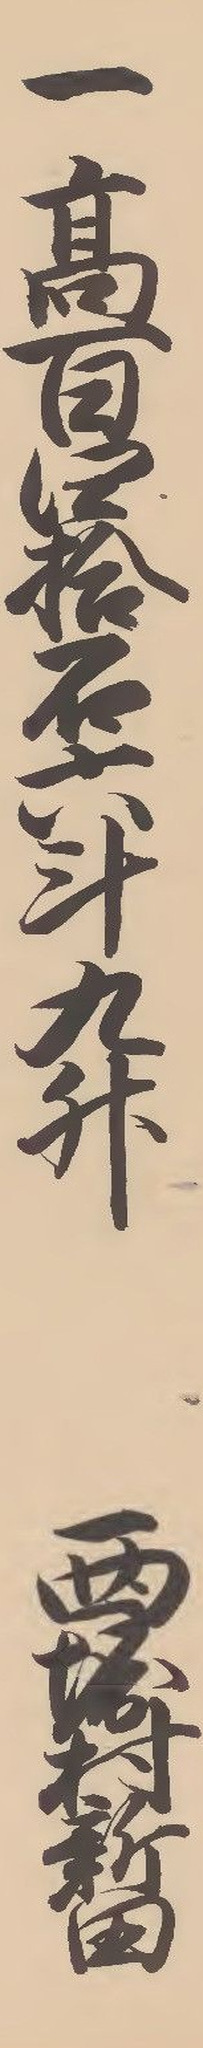一高百四拾石六斗九升西堀村新田
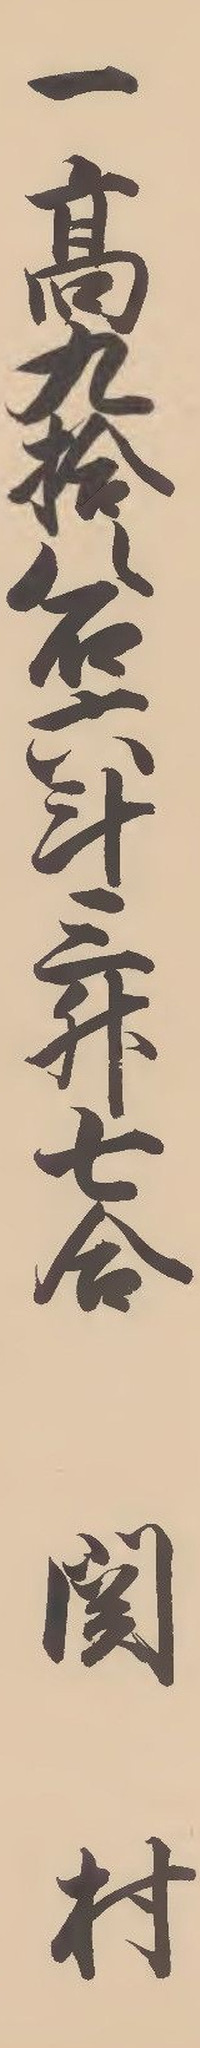一高九拾八石六斗三升七合関村
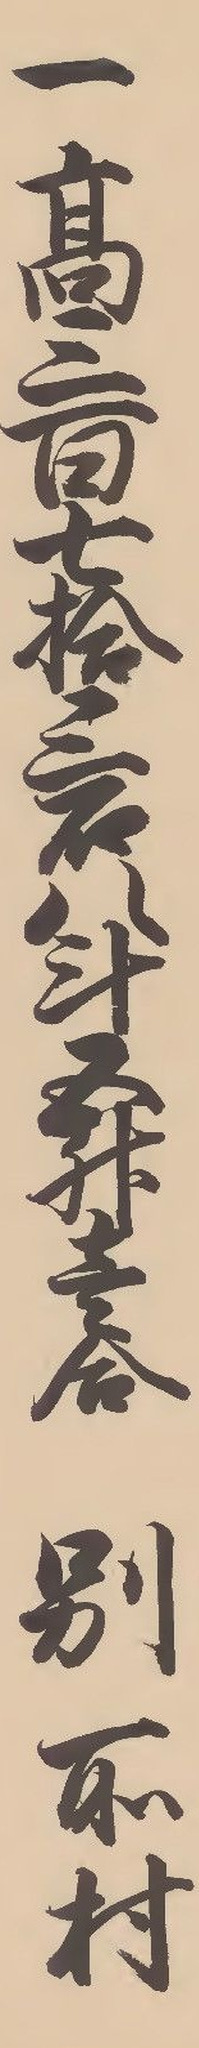一高三百七拾三石八斗五升壱合別所村
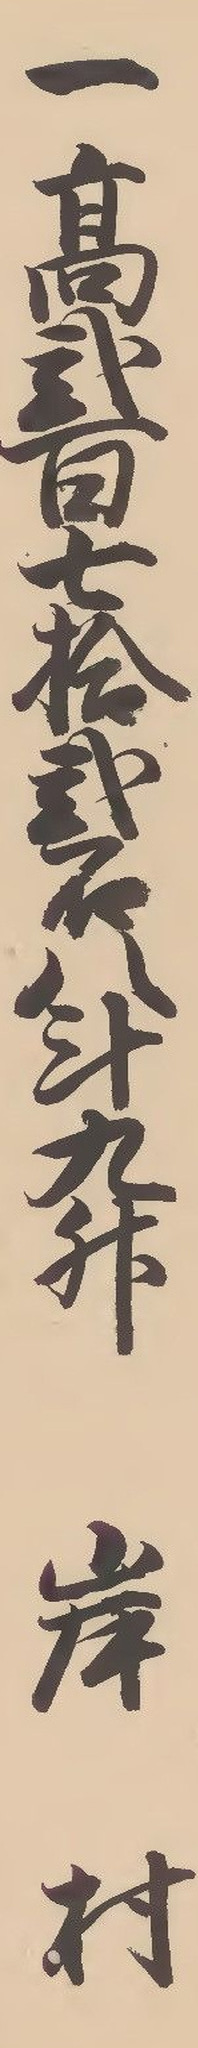一高弐百七拾弐石八斗九升岸村
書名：武蔵国郷帳　下
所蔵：国立公文書館 National Archives of Japan
